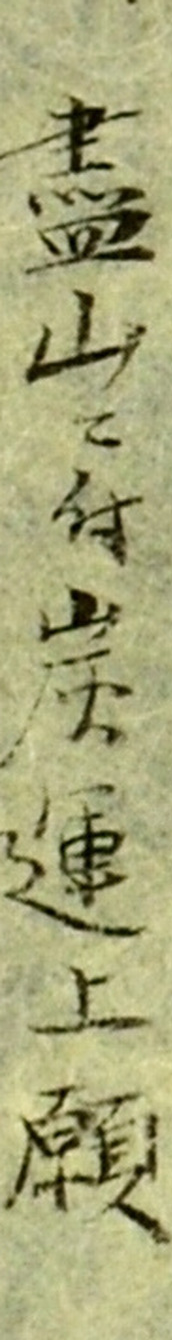盡山ニ付炭運上願

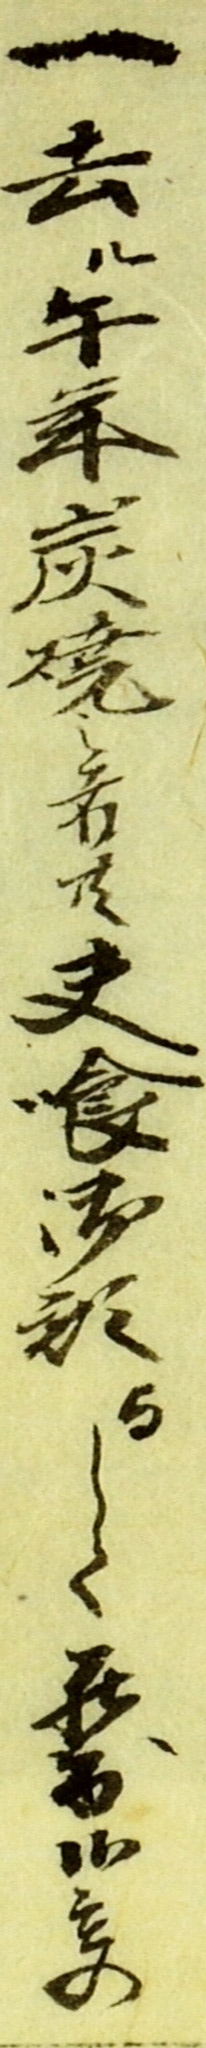一去ル午年炭焼之者共夫喰御願として罷出候もの
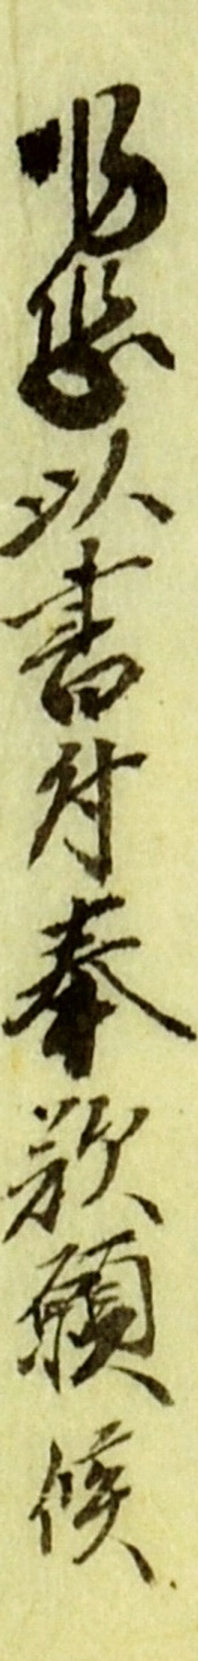乍恐以書付奉歎願候
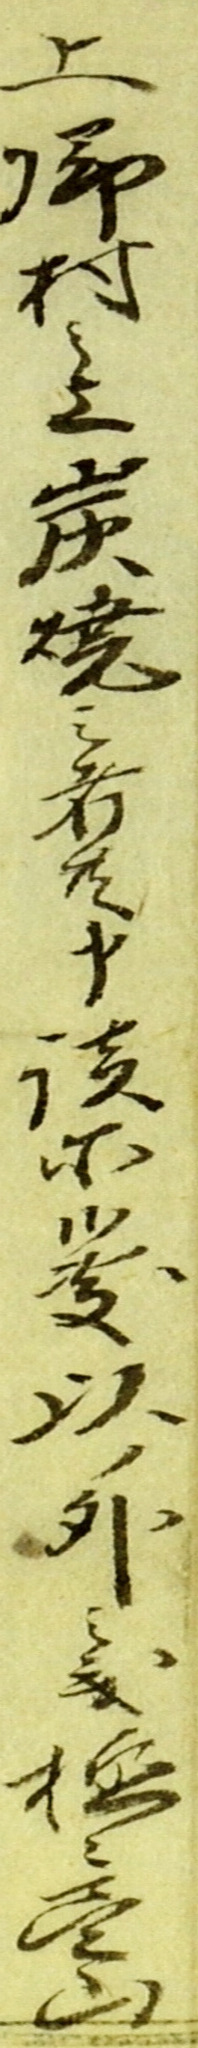上帰村之上炭焼之者共申談尓候処以ノ外之義極々尽山
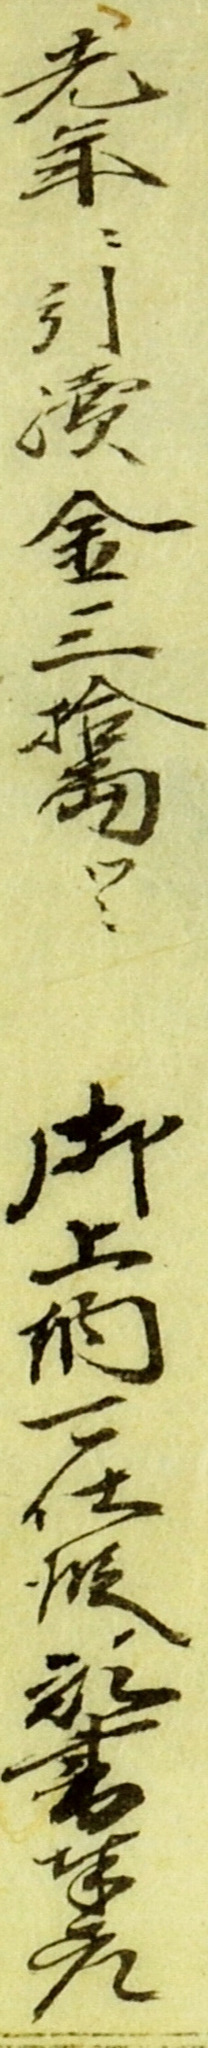先年ニ引続金三拾両ツゝ御上納可仕段願書奉差
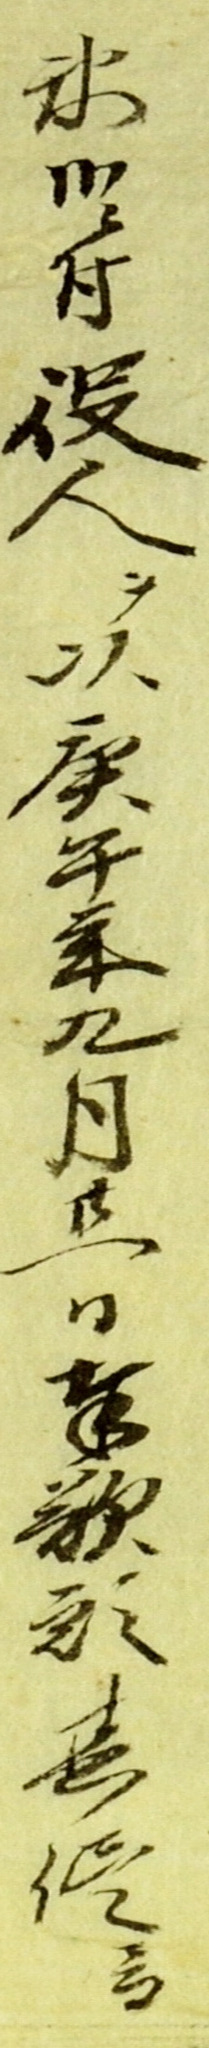束候ニ付役人ヲ以庚午年九月廿一日奉歎願甚侭ニ而
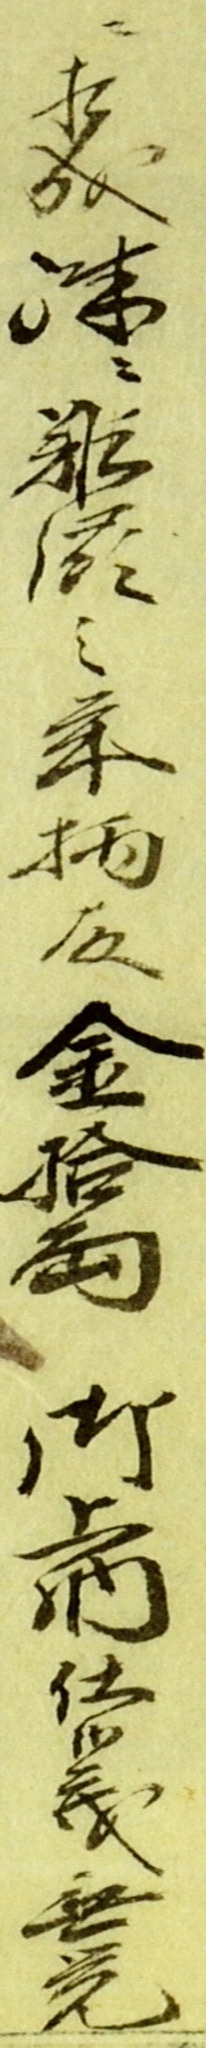ニ相成誠ニ難渋之年柄故金拾両御上納仕候茂無覚
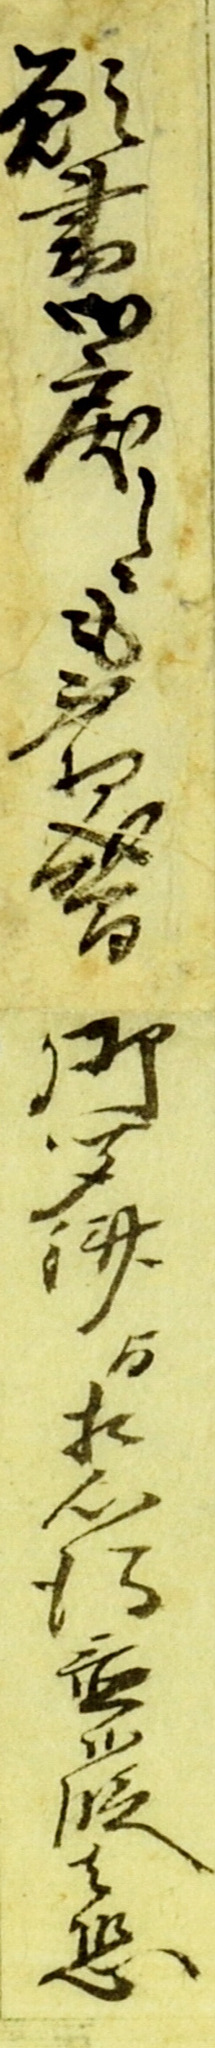願書御戻しニも不相成間御聞済と相心得置候段者恐
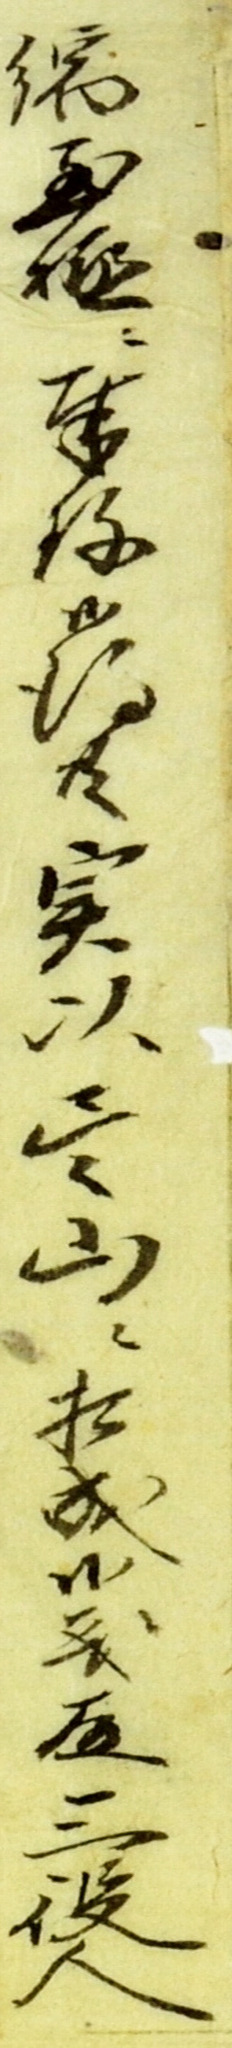縮至極ニ奉存候得共実以尽山ニ相成候義故三役人

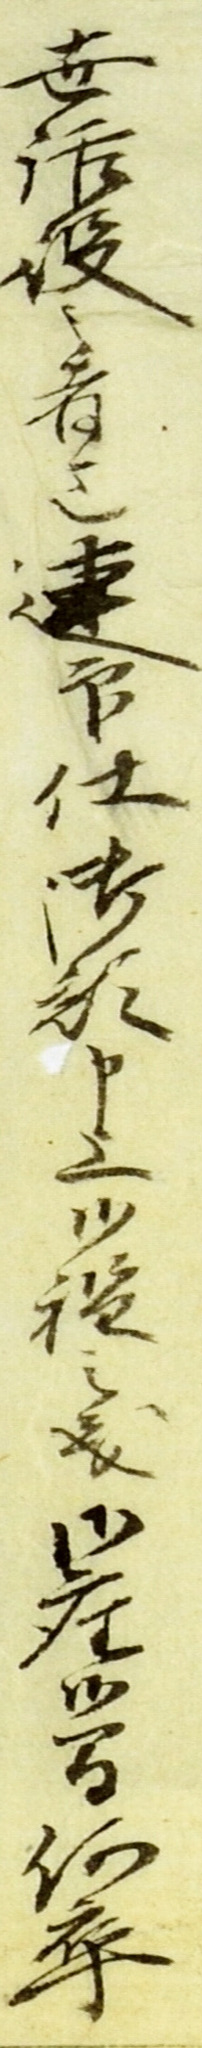世話役之者迄連印仕御願申上候控之義御座候間何卒
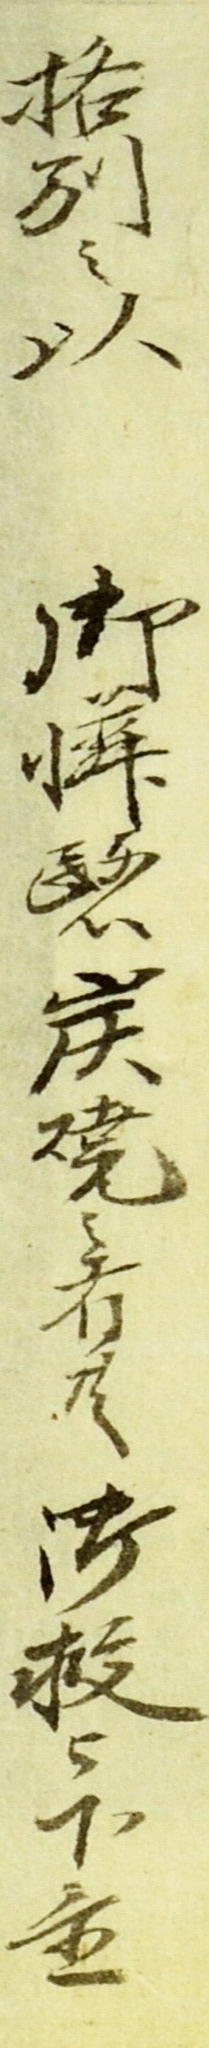格別之以御憐愍炭焼之者共御救被下置
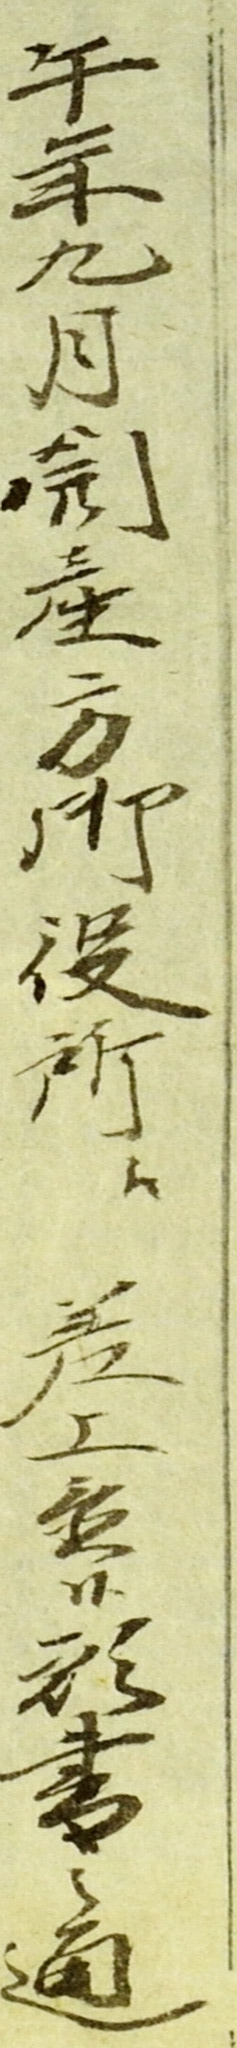午年九月開産方御役所江差上置候願書之通
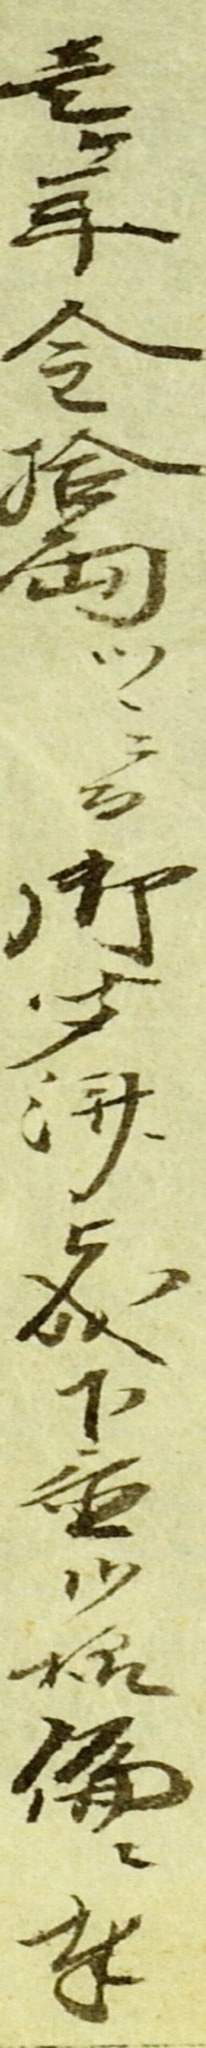壱ケ年金拾両ツゝニ而御聞済被成下置候様偏ニ奉
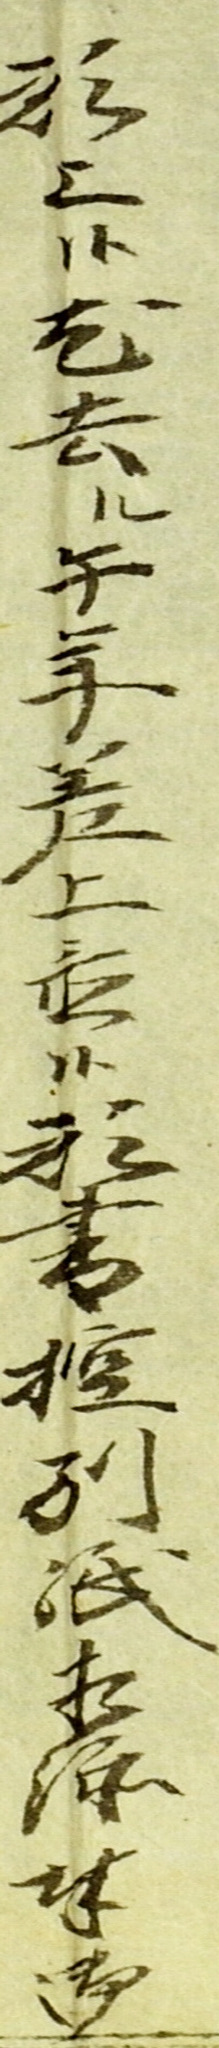願上候尤去ル午年差上置候願書控別紙相添奉御
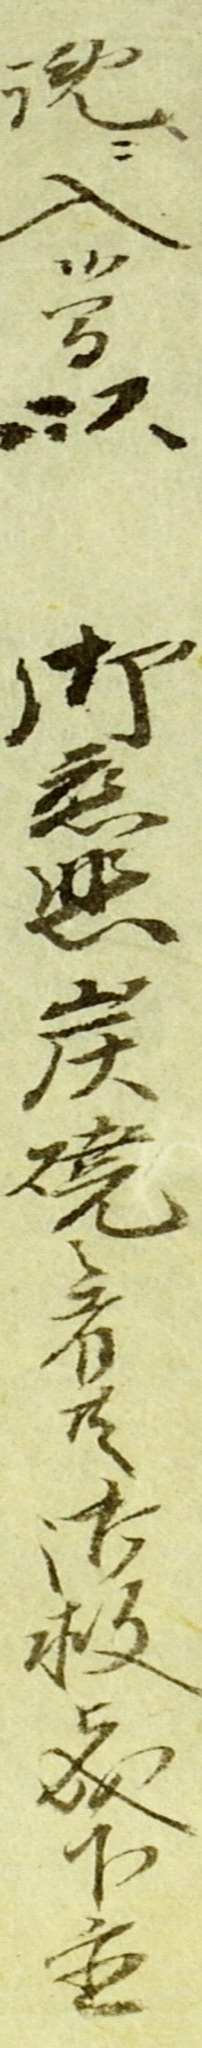覧ニ入候間以御慈悲炭焼之者共御救被成下置
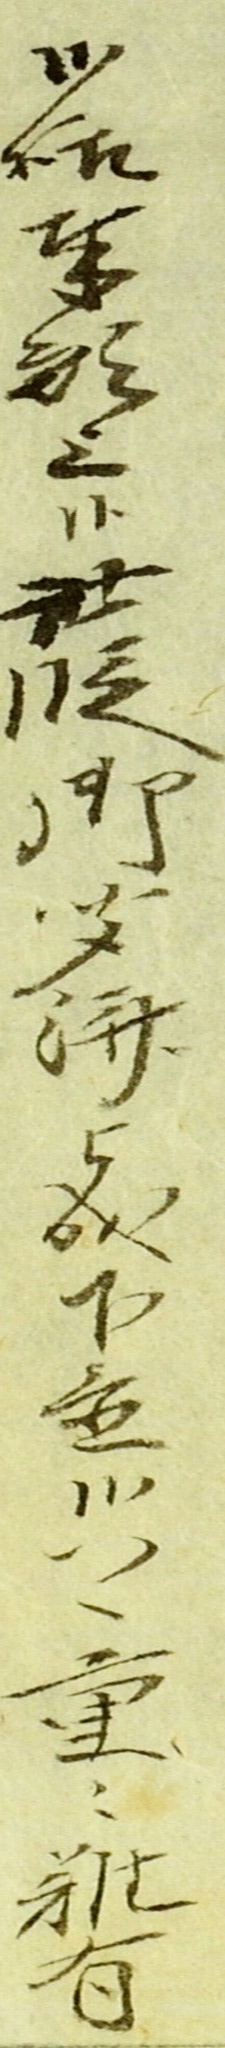候様奉願上候此段御聞済被成下置候ハゝ重々難有
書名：乍恐以書付奉嘆願候
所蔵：伊那市立高遠町図書館・合同会社AMANE
